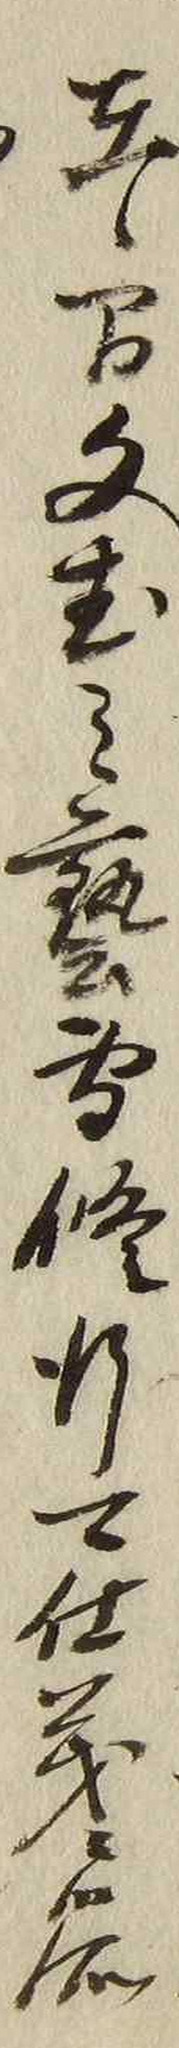在候間文武之芸専修行可仕義ニ候所
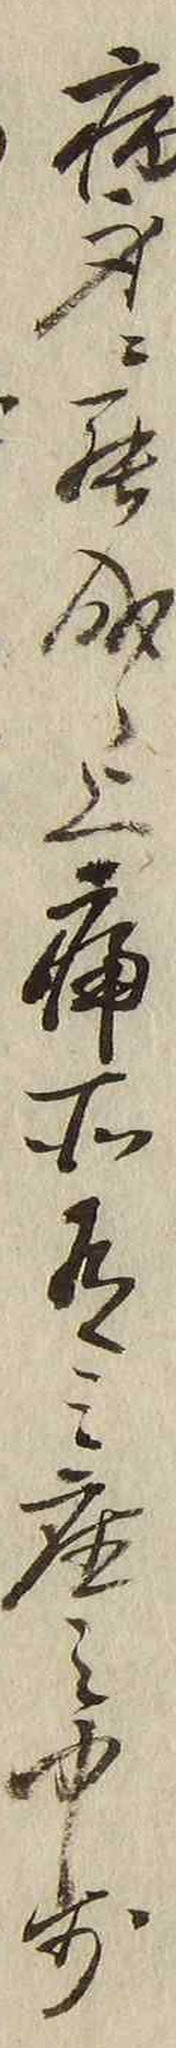病身ニ罷成候上痛所有之座之中歩
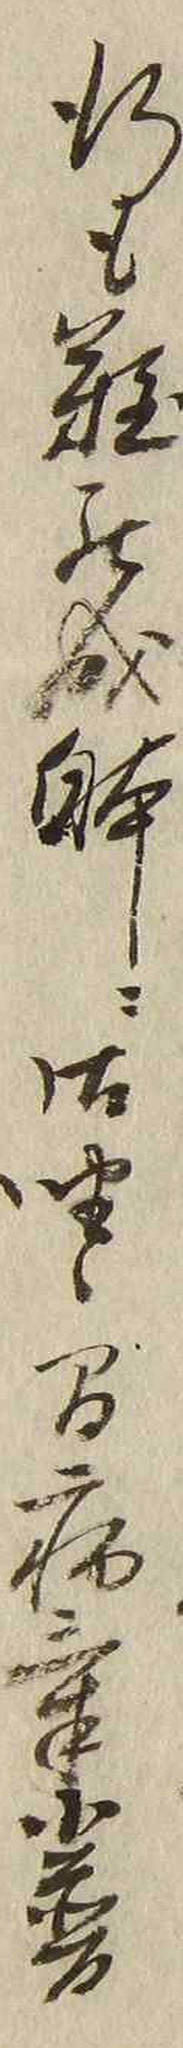行も難罷成体ニ御座候間病気小普

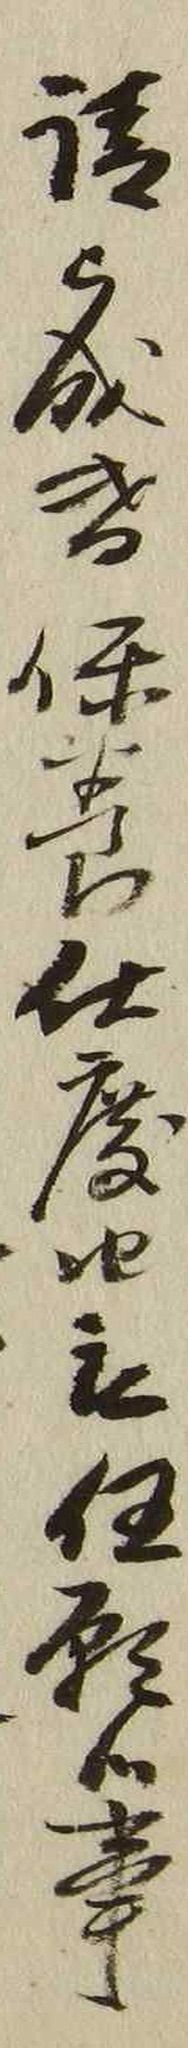請被成替保養仕度由被任願候事
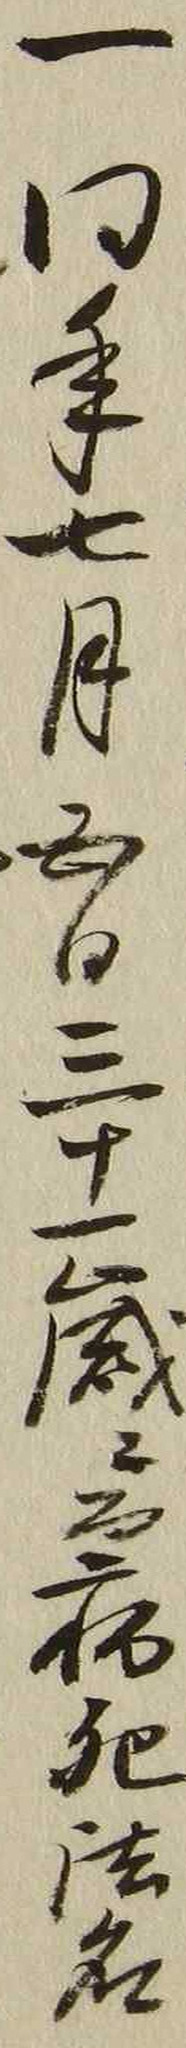一同年七月五日三十一歳ニ而病死法名
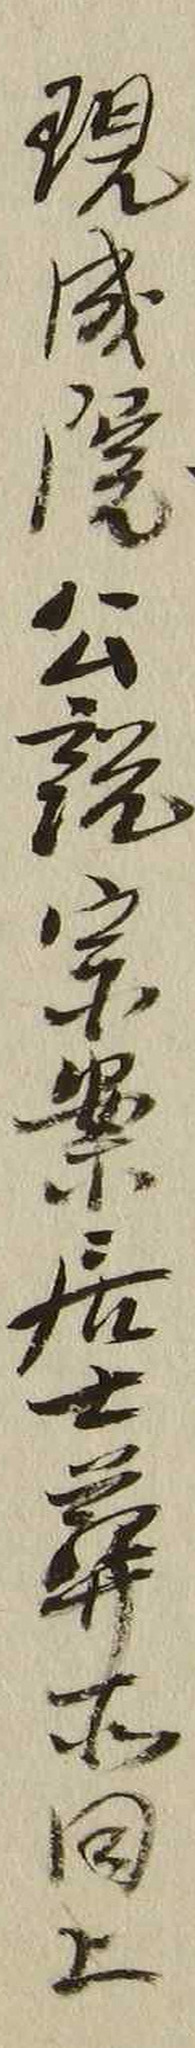現成院公説宗案居士葬所同上
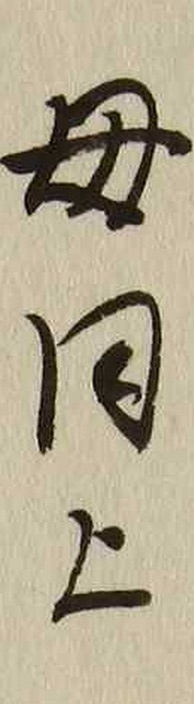母同上
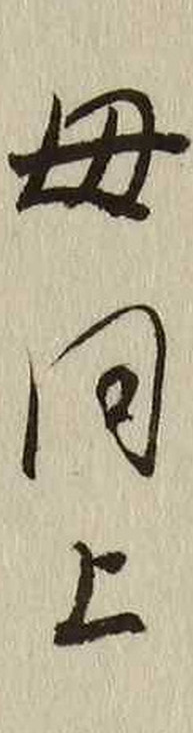母同上
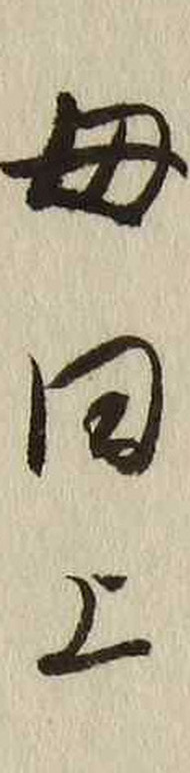母同上
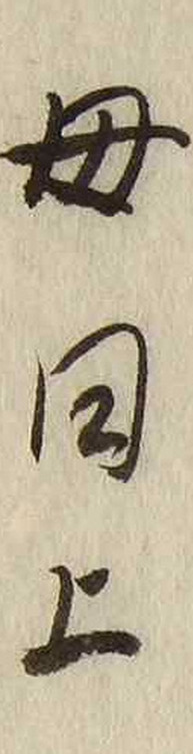母同上

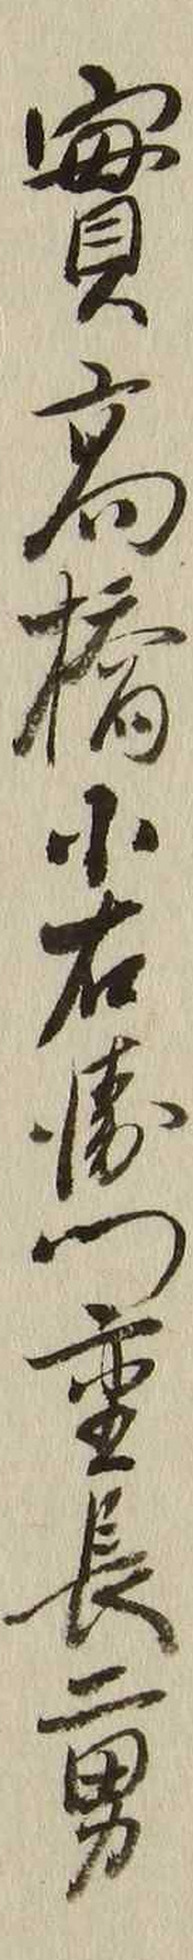実高橋小右衛門重長二勇
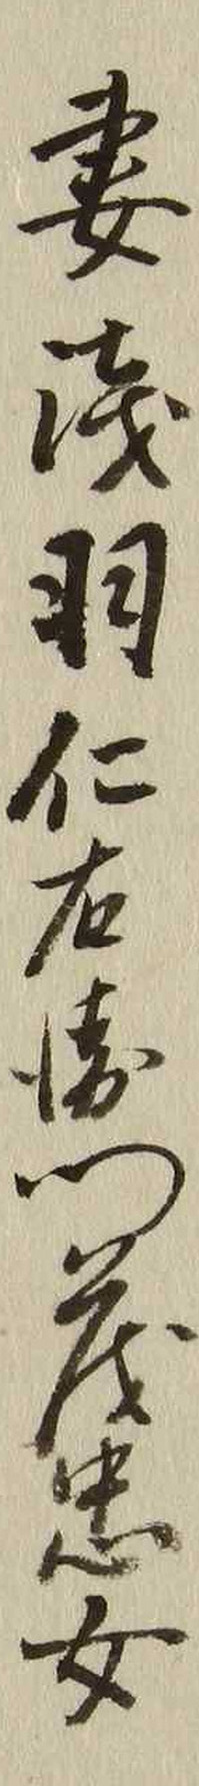妻浅羽仁右衛門茂忠女
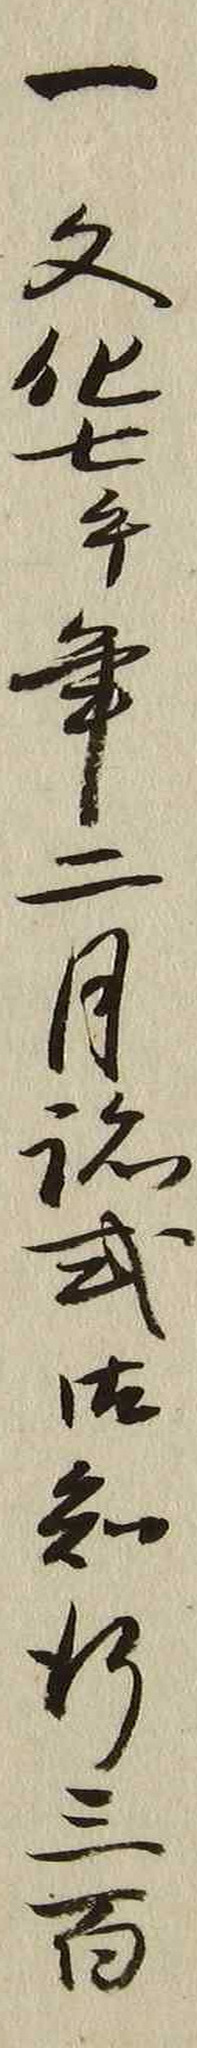一文化七午年二月跡式御知行三百
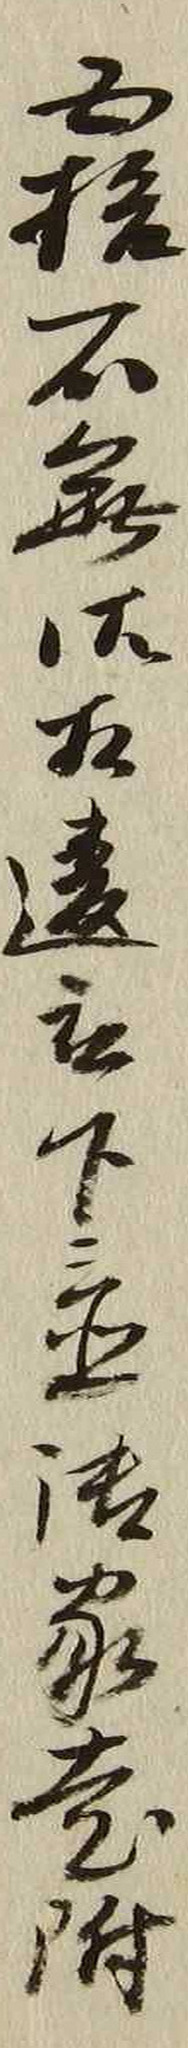五拾石無御相違被下置御家老附
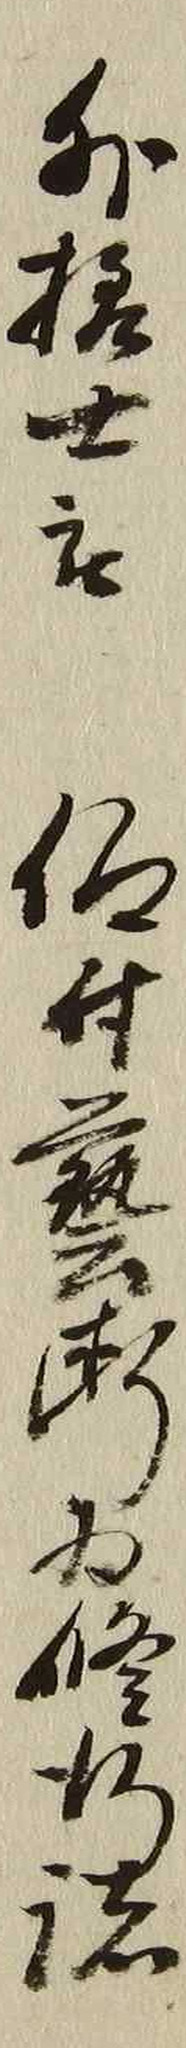外様士被仰付芸術為修行諸
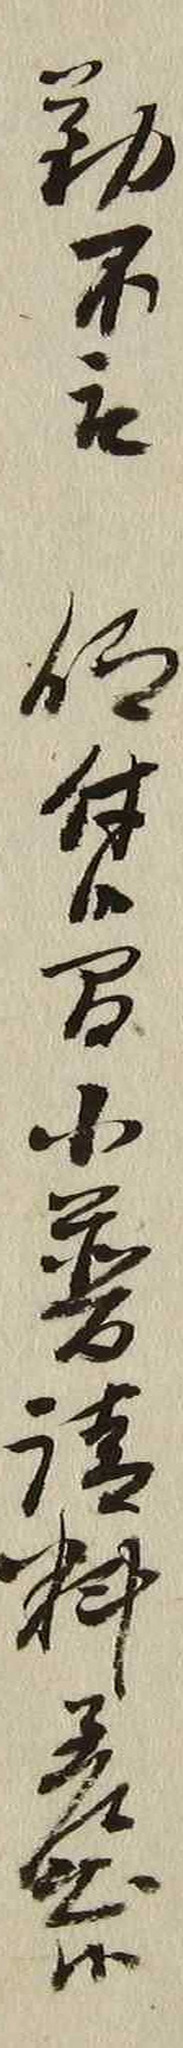勤不被仰付候間小普請料差出候
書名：諸士系譜　巻之355　す之部5
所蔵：会津若松市立会津図書館
